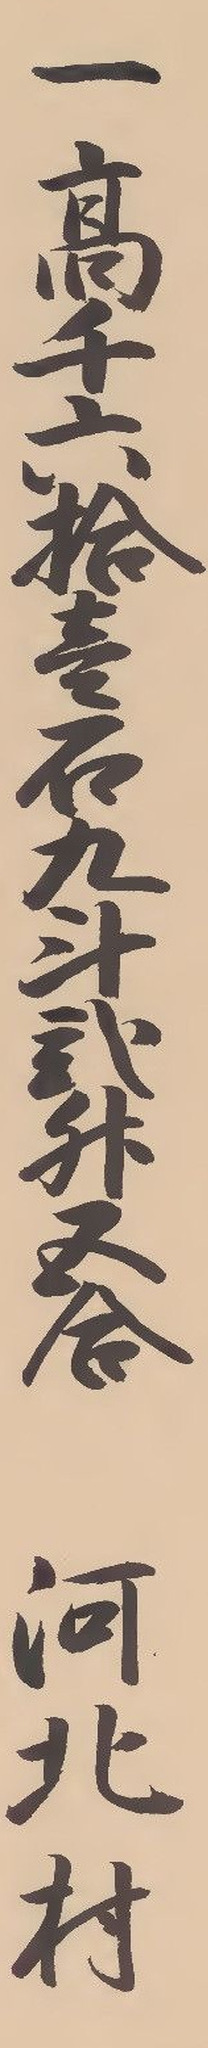一高千六拾壱石九斗弐升五合河北村
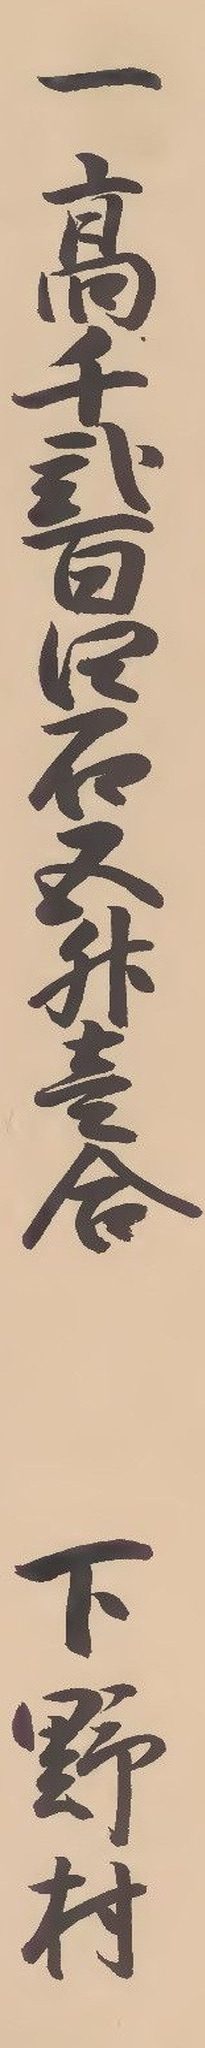一高千弐百四石五升壱合下野村
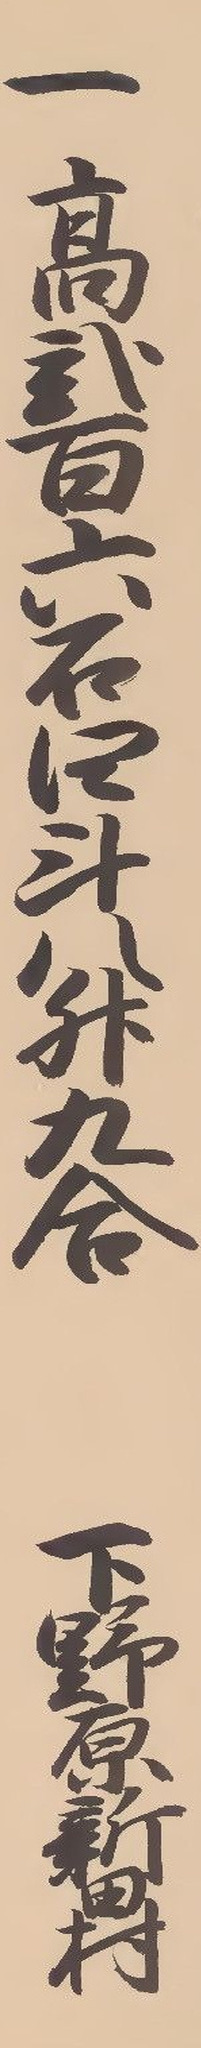一高弐百六石四斗八升九合下野原新田村
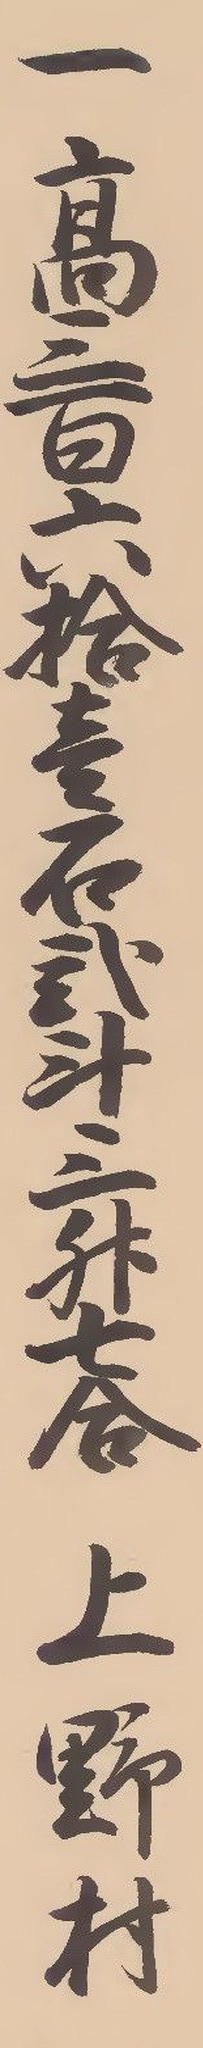一高三百六拾壱石弐斗三升七合上野村

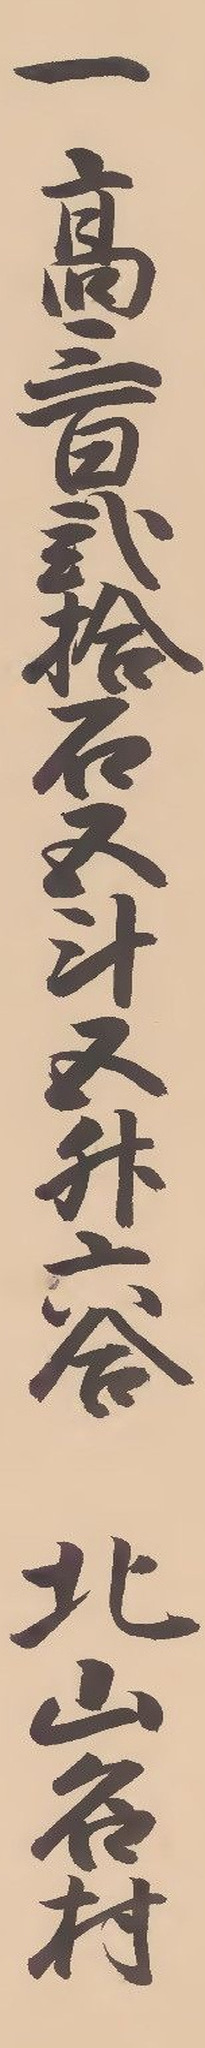一高三百弐拾石五斗五升六合北山名村
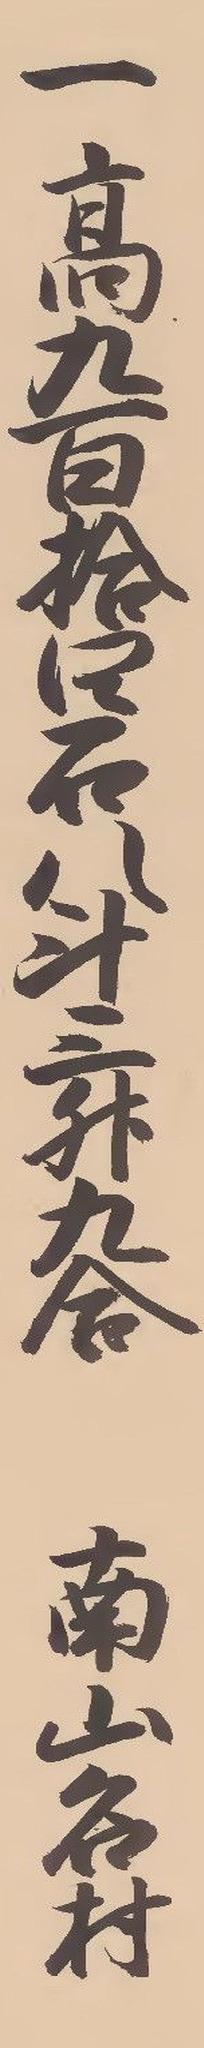一高九百拾四石八斗三升九合南山名村
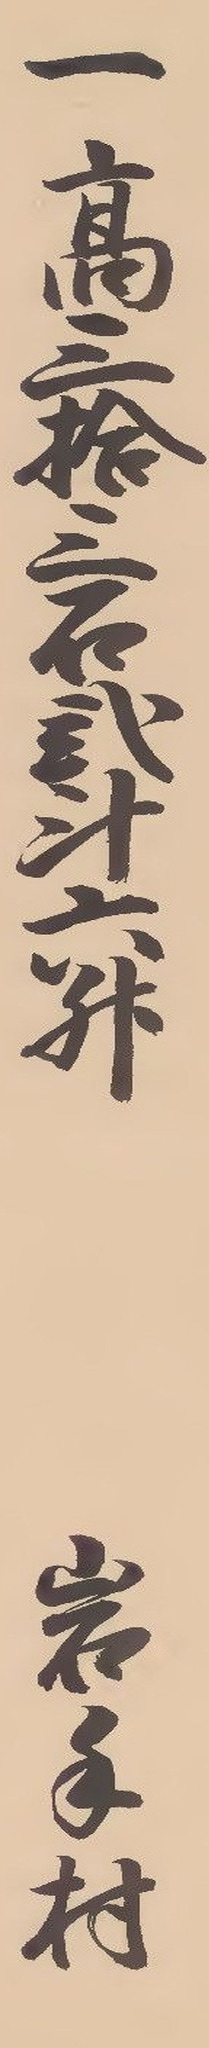一高三拾三石弐斗六升岩手村
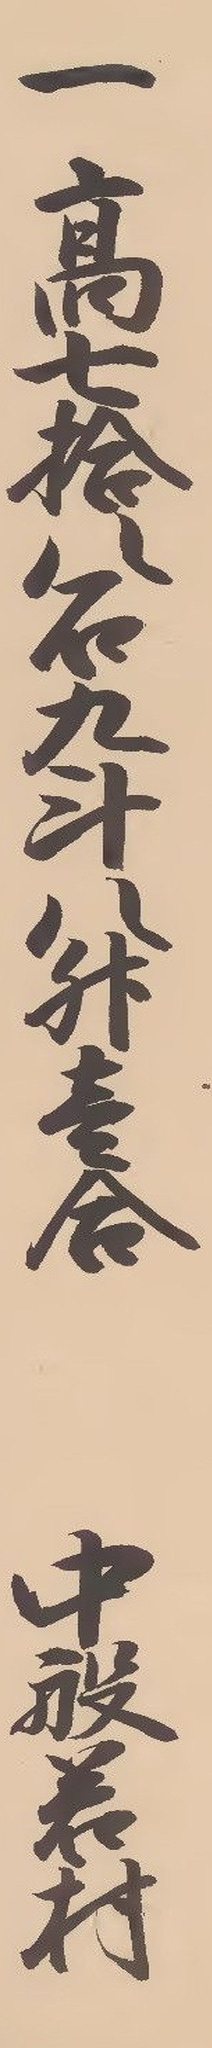一高七拾八石九斗八升壱合中般若村
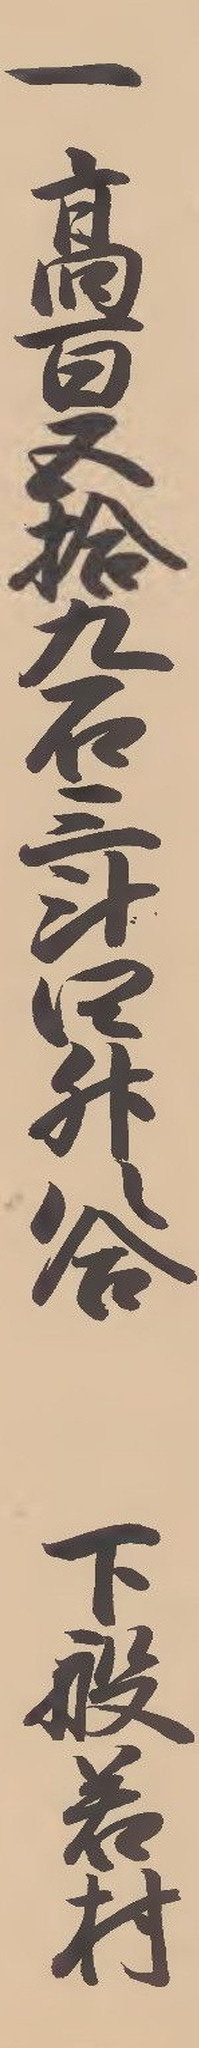一高百五拾九石三斗四升八合下般若村
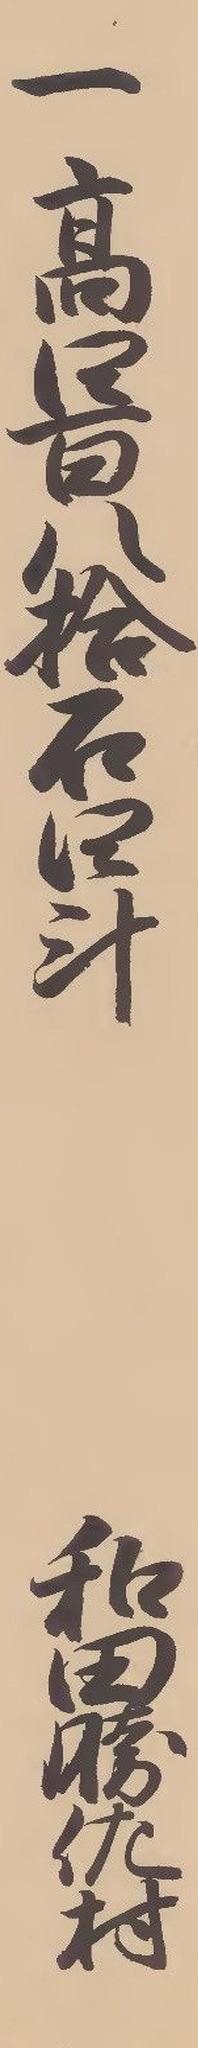一高四百八拾石四斗和田勝佐村
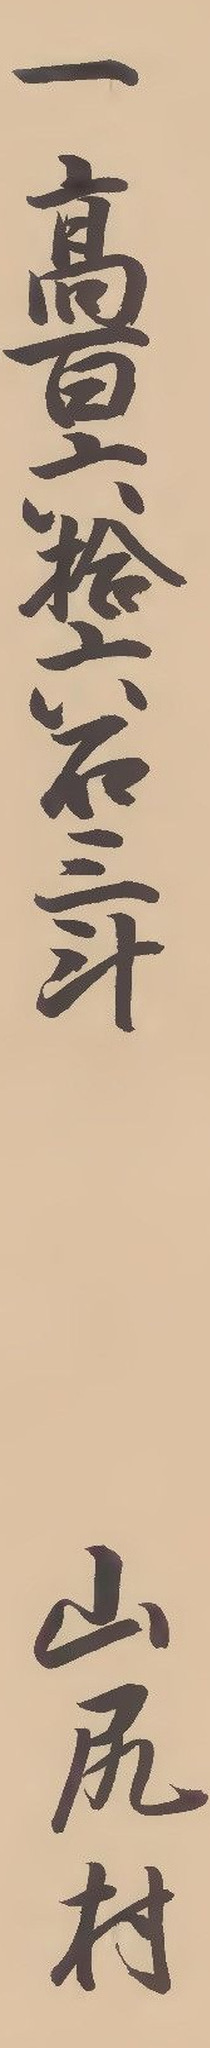一高百六拾六石三斗山尻村
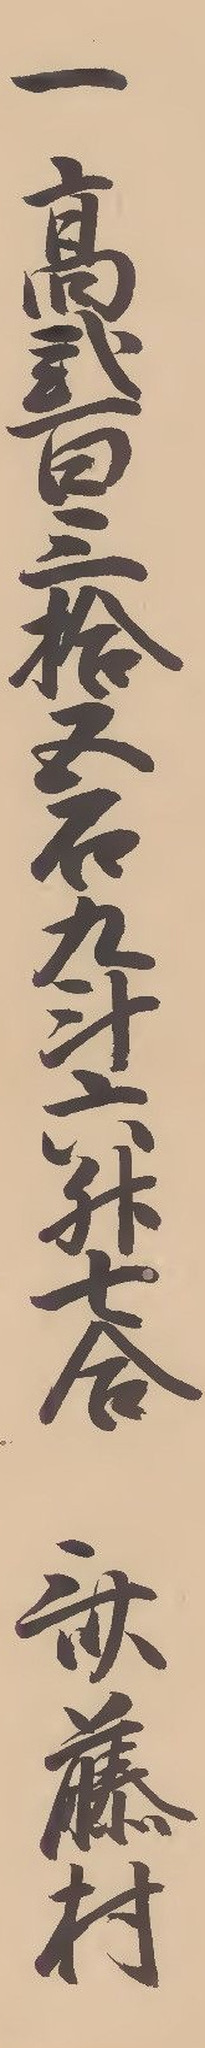一高弐百三拾五石九斗六升七合斎藤村

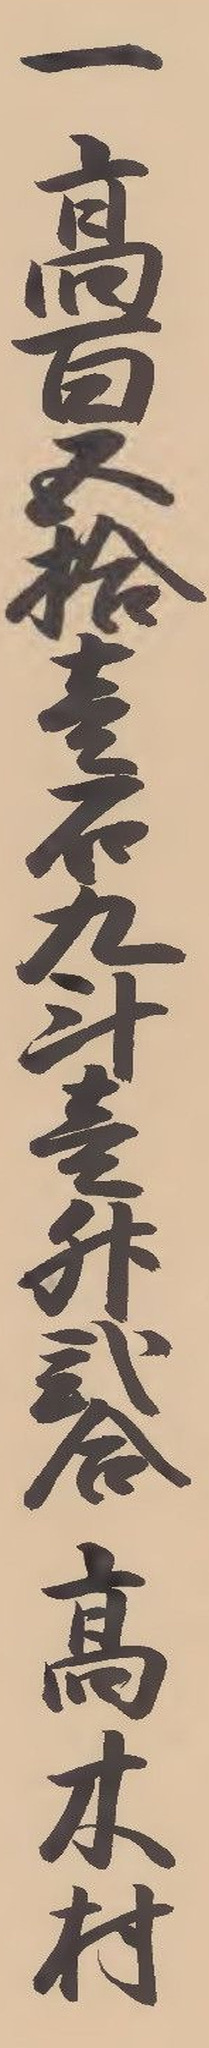一高百五拾壱石九斗壱升弐合高木村
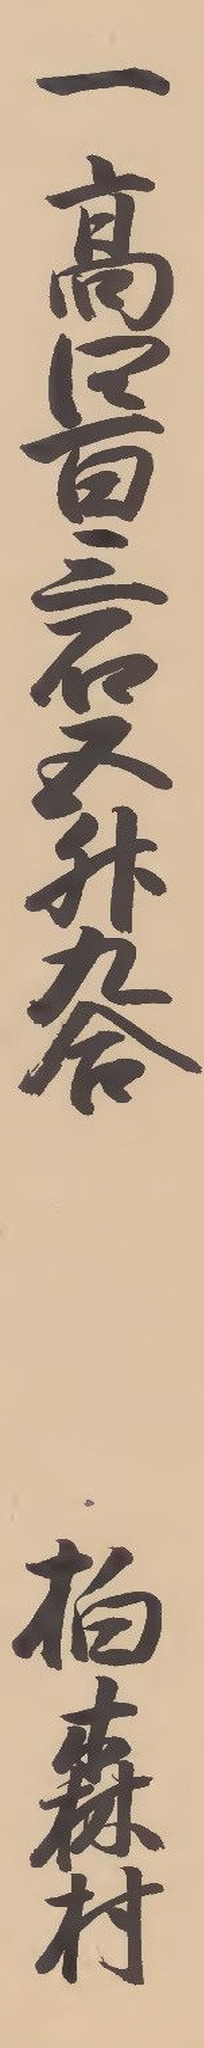一高四百三石五升九合柏森村
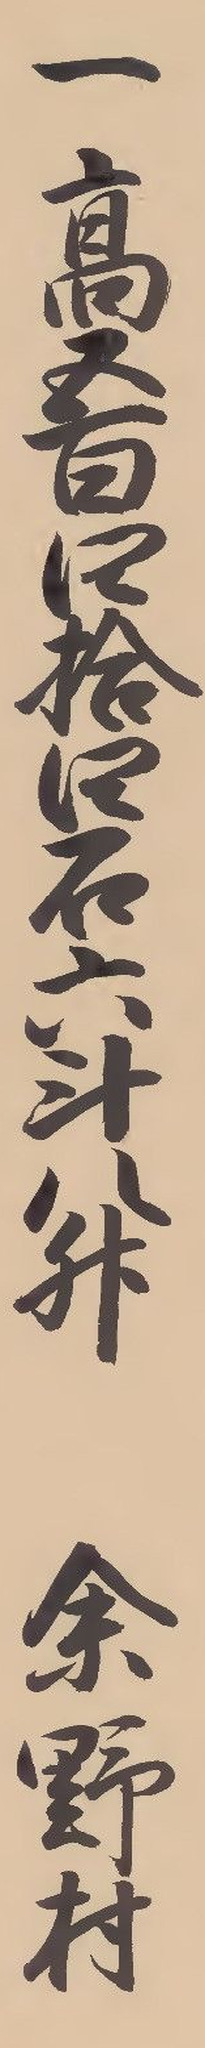一高五百四拾四石六斗八升余野村
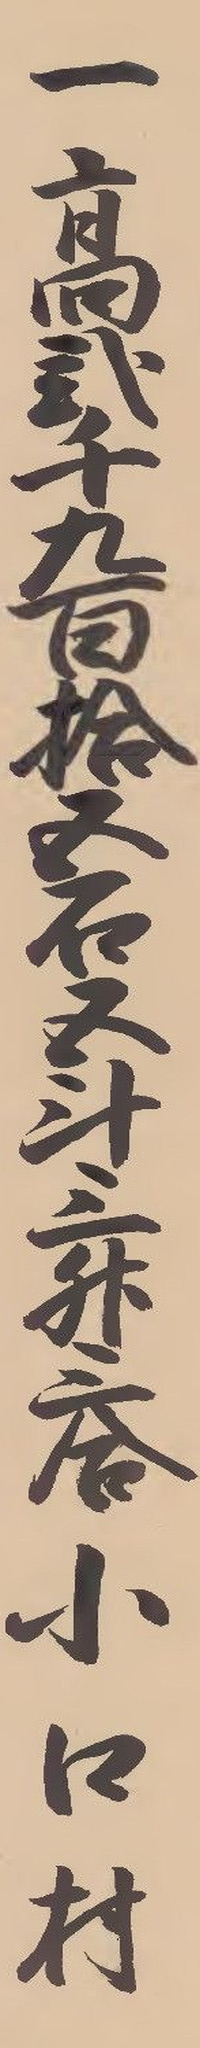一高弐千九百拾五石五斗三升三合小口村
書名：尾張国郷帳
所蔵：国立公文書館 National Archives of Japan
